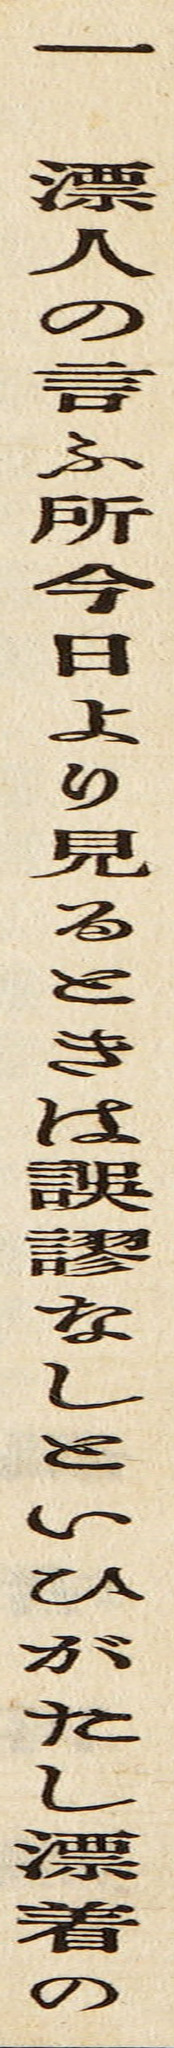一漂人の言ふ所今日より見るときは誤謬なしといひがたし漂着の
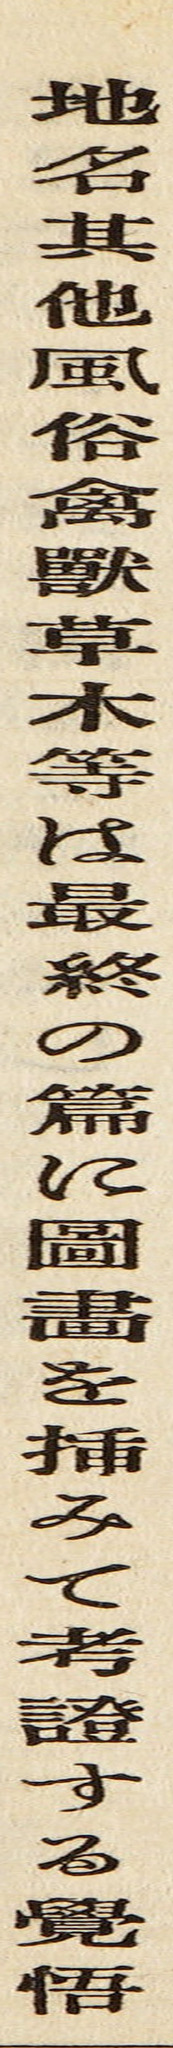地名其他風俗禽獣草木等は最終の篇に図画を挿みて考証する覚悟
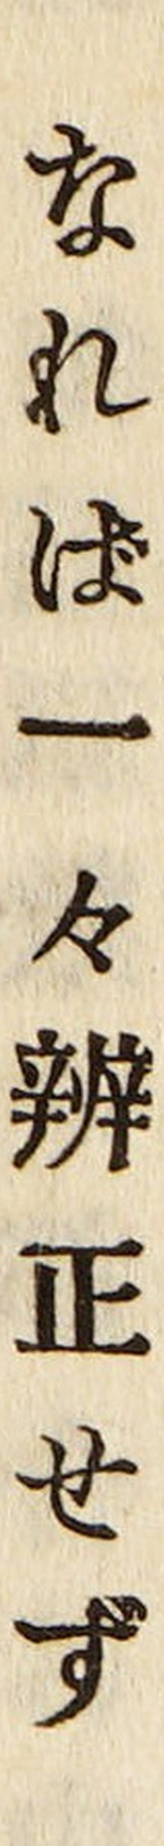なれば一々弁正せず
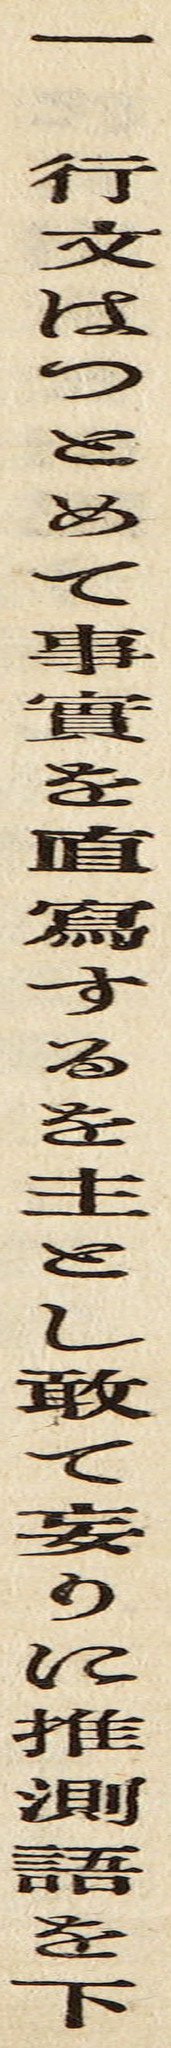一行文はつとめて事実を直写するを主とし敢て妄りに推測語を下

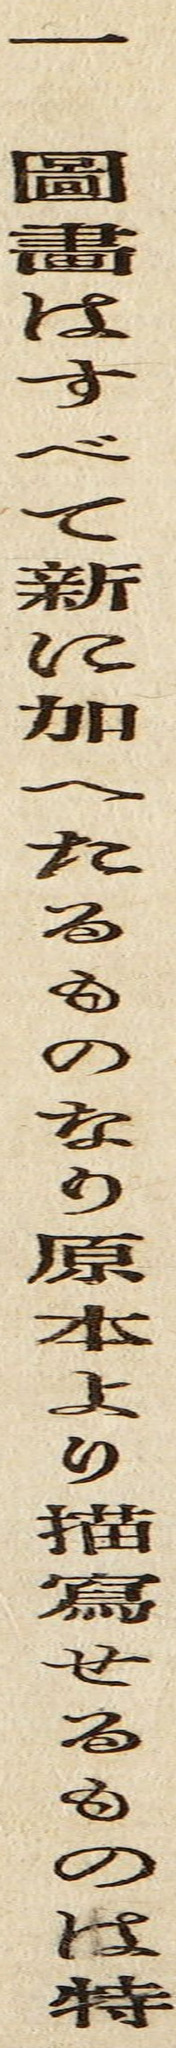一図画はすべて新に加へたるものなり原本より描写せるものは特
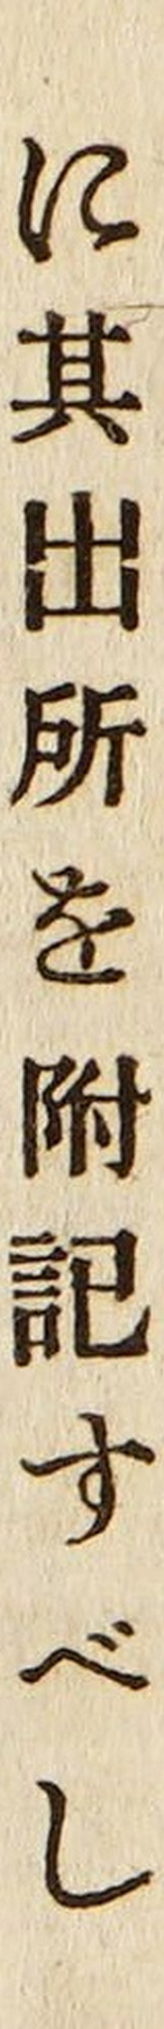に其出所を附記すべし
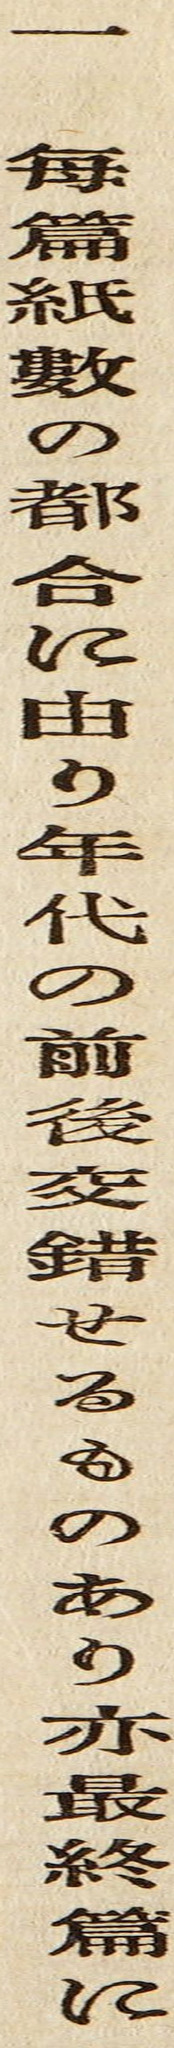一毎篇紙数の都合に由り年代の前後交錯せるものあり亦最終篇に
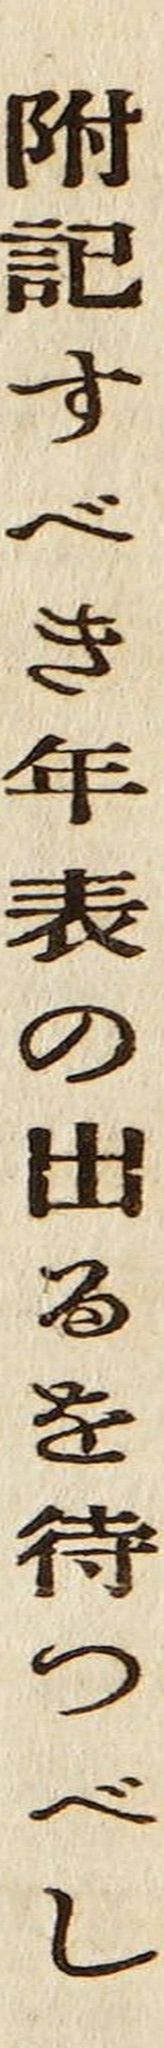附記すべき年表の出るを待つべし
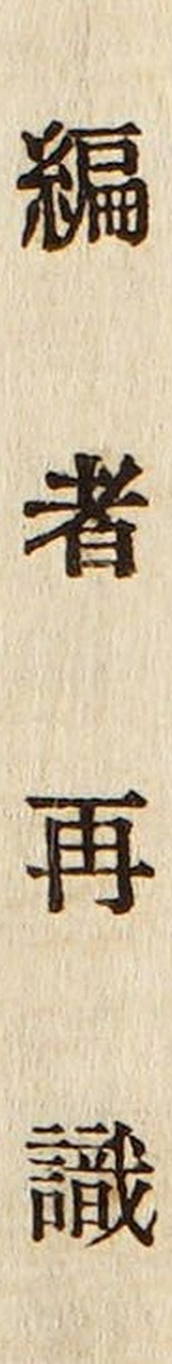編者再識
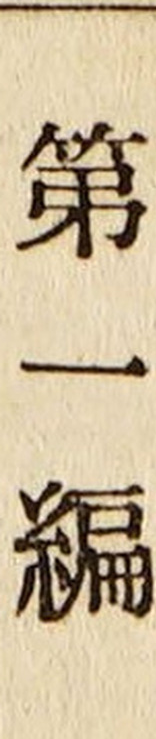第一編
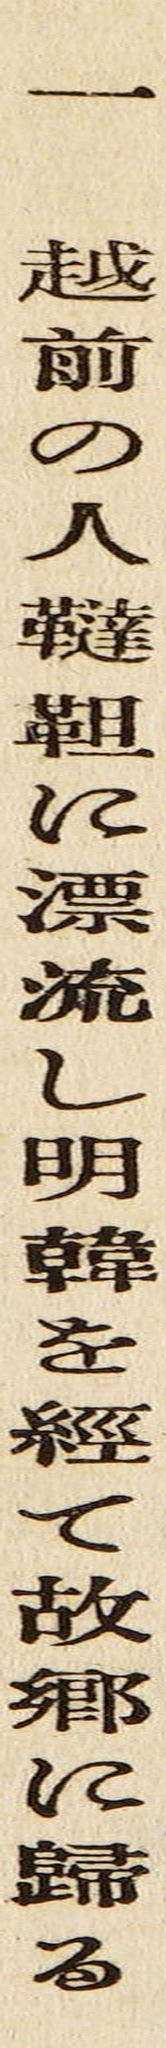一越前の人韃靼に漂流し明韓を経て故郷に帰る一丁
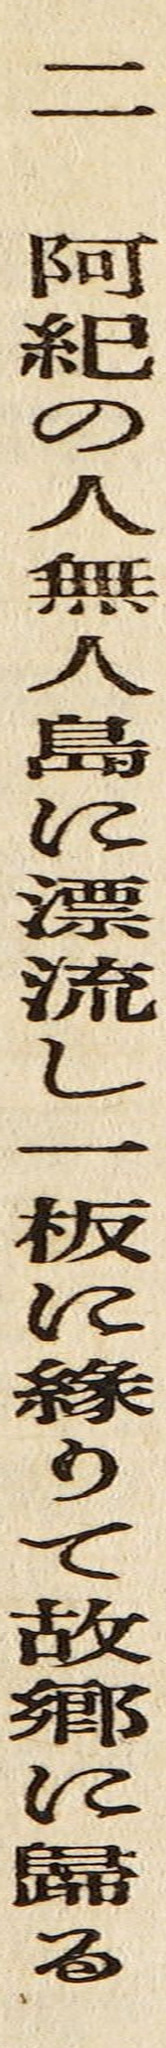二阿紀の人無人島に漂流し一板に縁りて故郷に帰る二十七丁
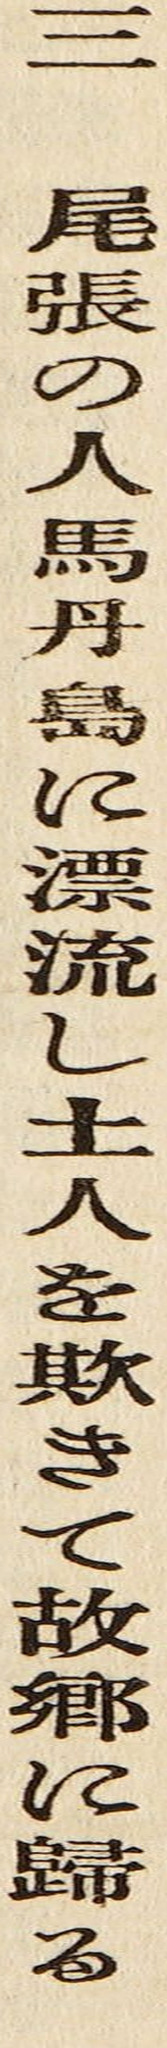三尾張の人馬丹島に漂流し土人を欺きて故郷に帰る三十九丁
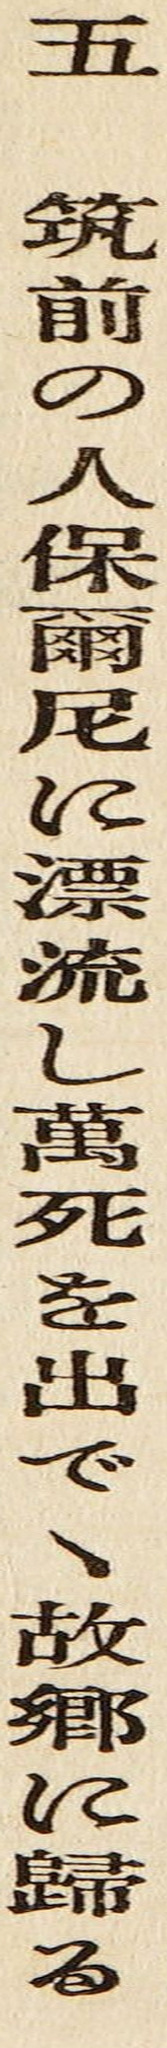五筑前の人保爾尼に漂流し万死を出でヽ故郷に帰る九十三丁
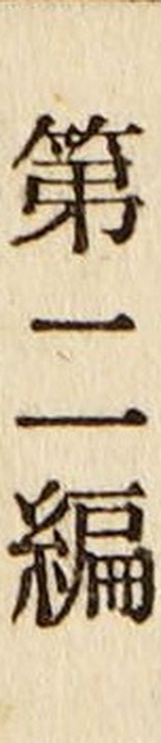第二編
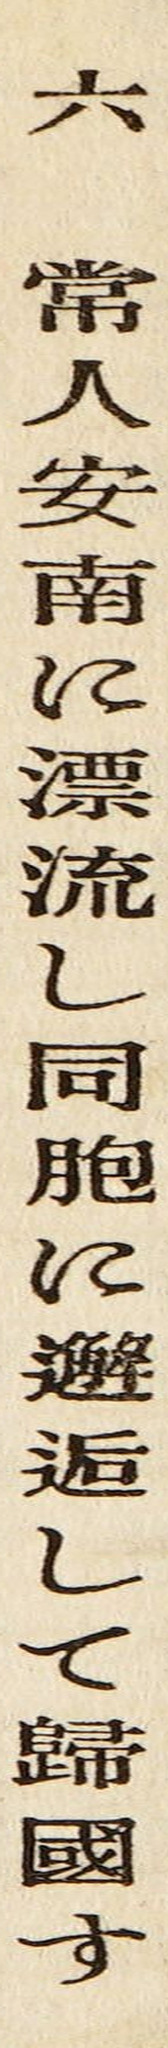六常人安南に漂流し同胞に邂逅して帰国す一丁
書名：日本漂流譚
